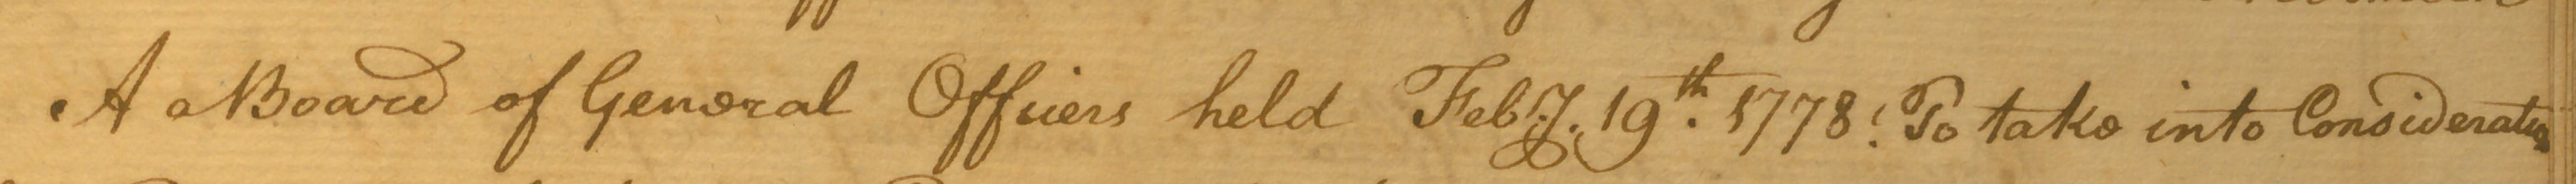A Board of General Officers held Feb^y. 19^th. 1778. To take into Consideration
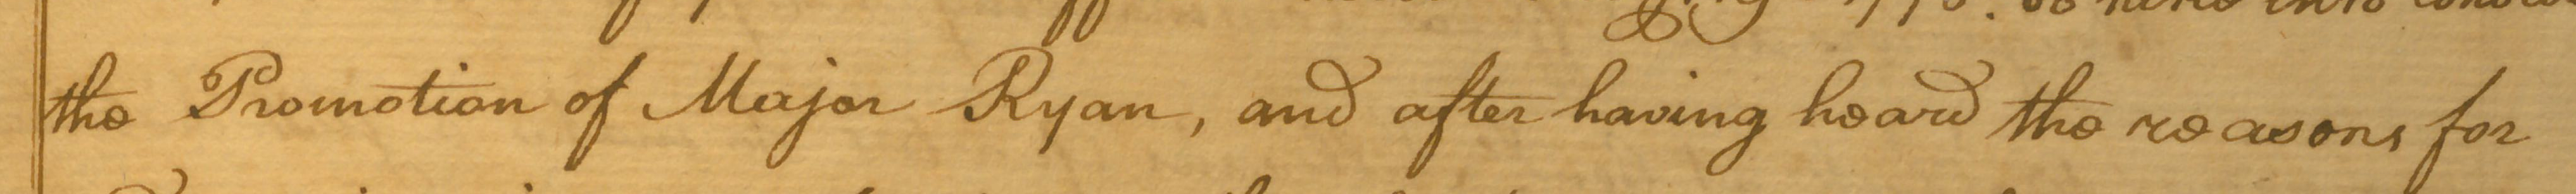the Promotion of Major Ryan, and after having heard the reasons for
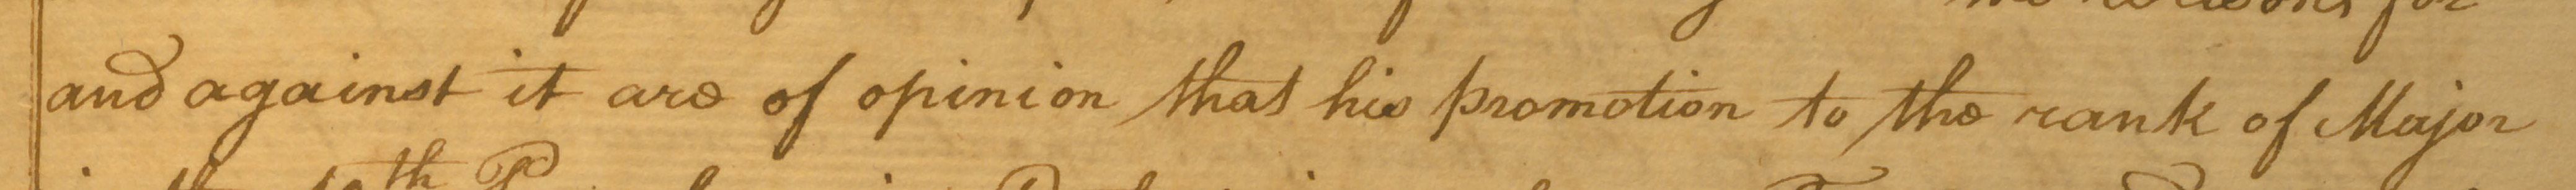and against it are of opinion that his promotion to the rank of Major
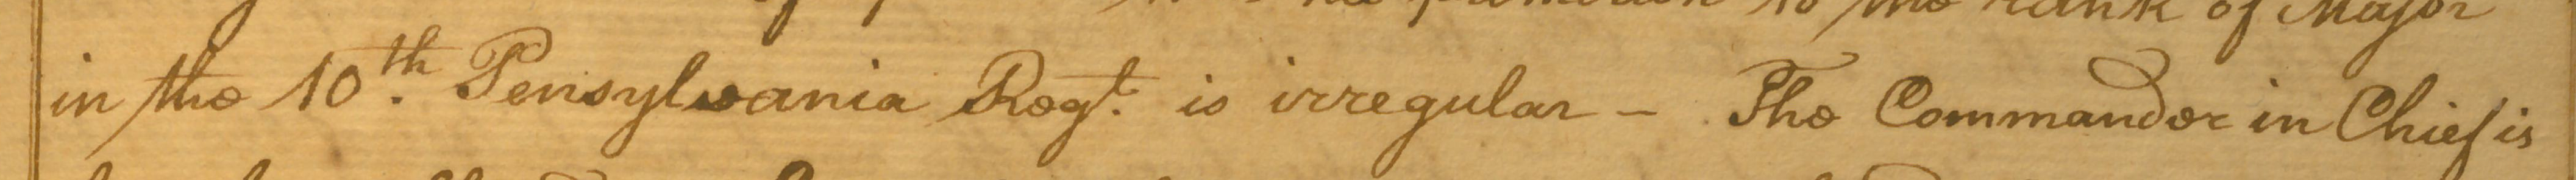in the 10^th. Pensylvania Reg^t. is irregular- The Commander in Chief is
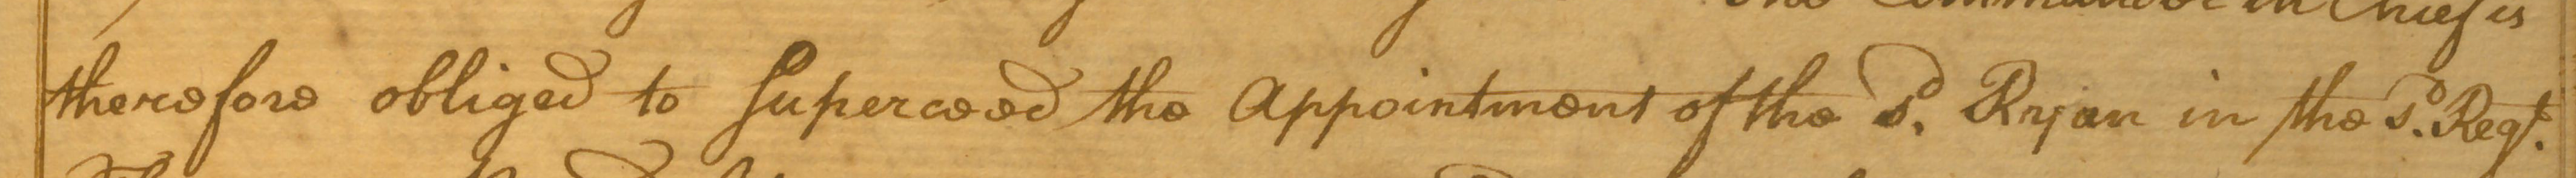therefore obliged to superceed the Appointment of the s^d. Ryan in the s^d. Reg^t.
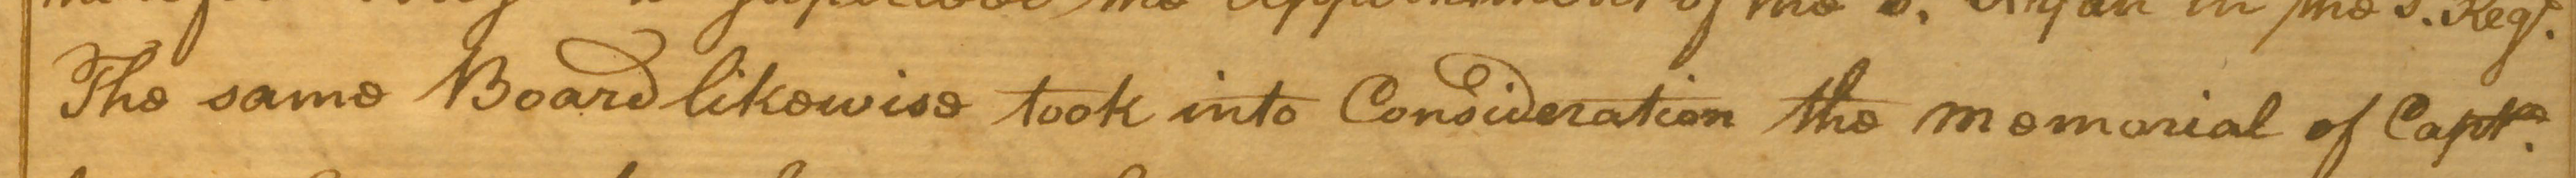The same Board likewise took into Consideration the memorial of Capt^n.
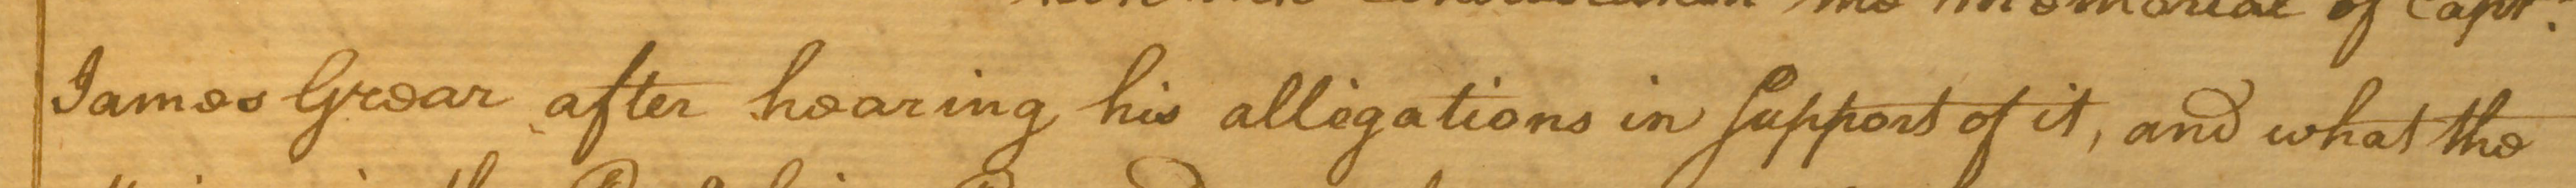James Grear after hearing his alligations in support of it, and what the
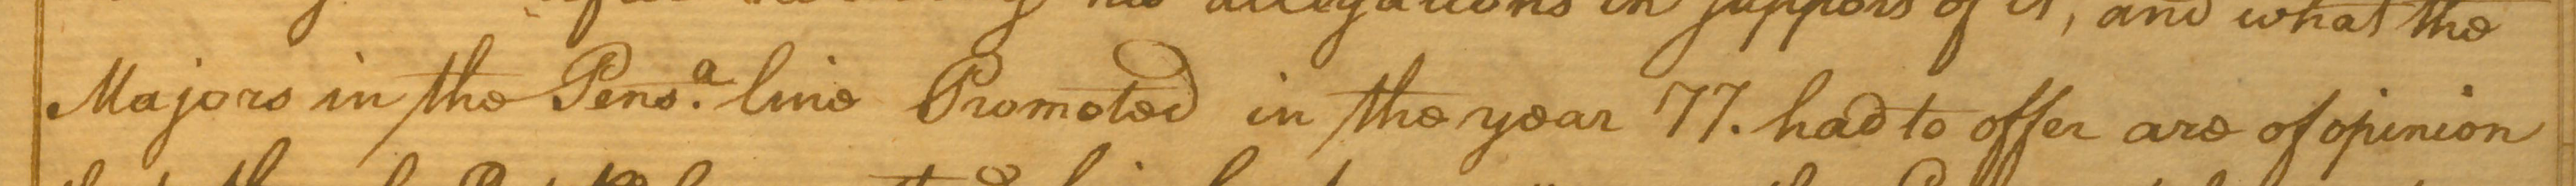Majors in the Pens^a. line Promoted in the year 77. had to offer are of opinion
